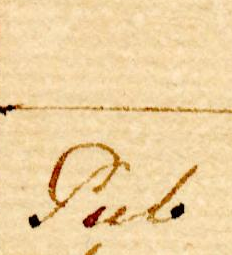Park
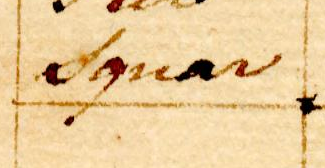Square
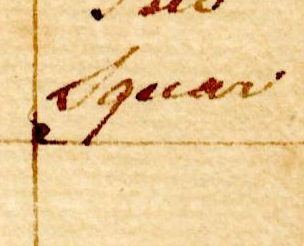Square
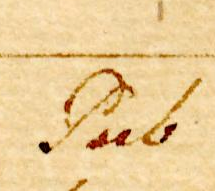Pub
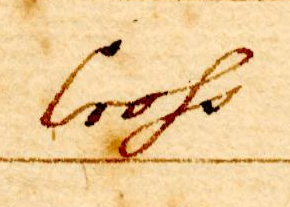Cross
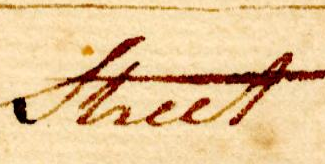Street
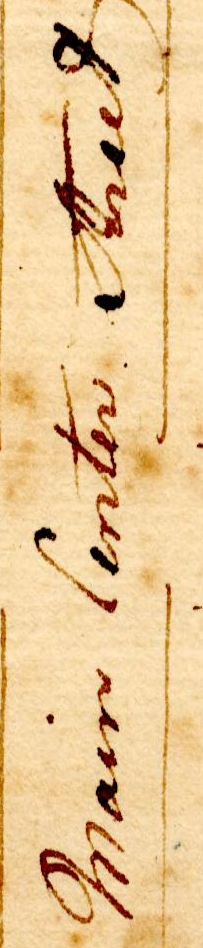Main Center Street
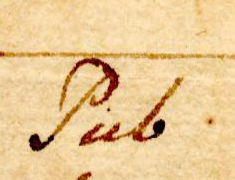Pub
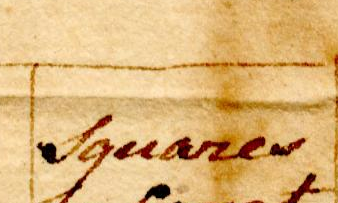Squares
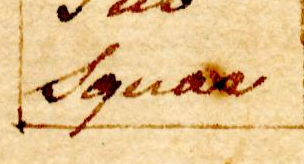square
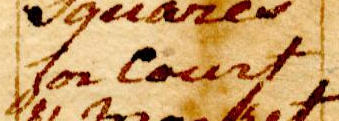for court
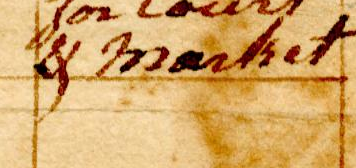& market
